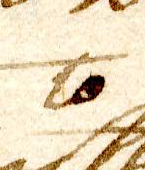to
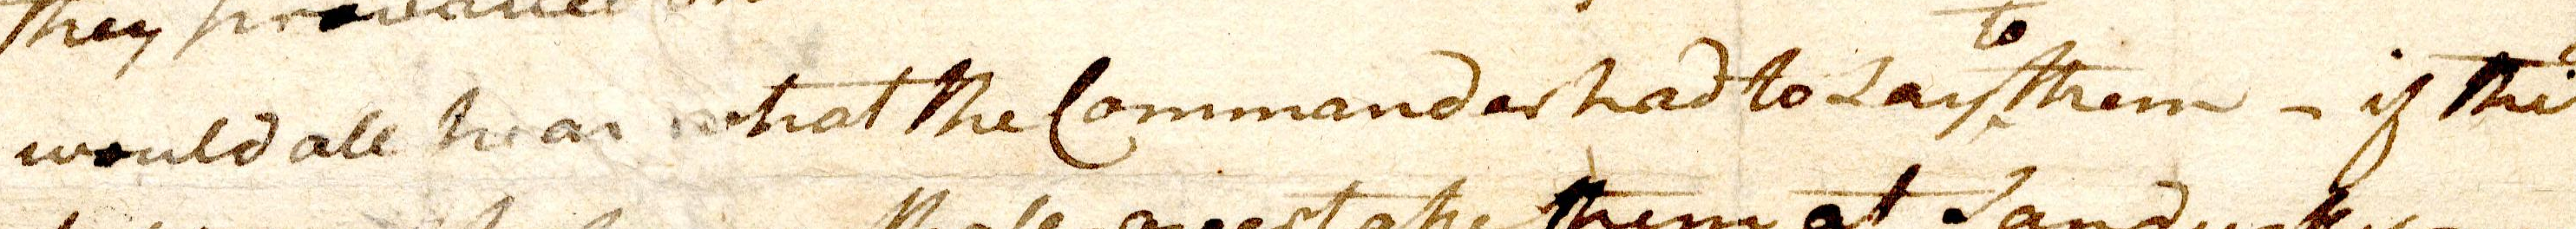would all hear what the Commander had to say ^ them- if this
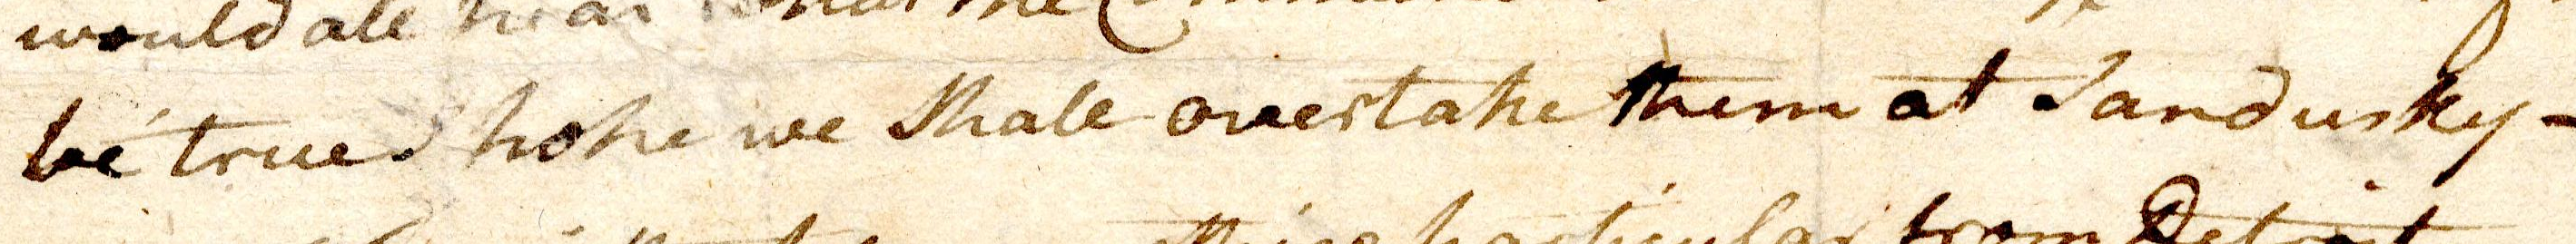be true I hope we Shall overtake them at Sandusky-
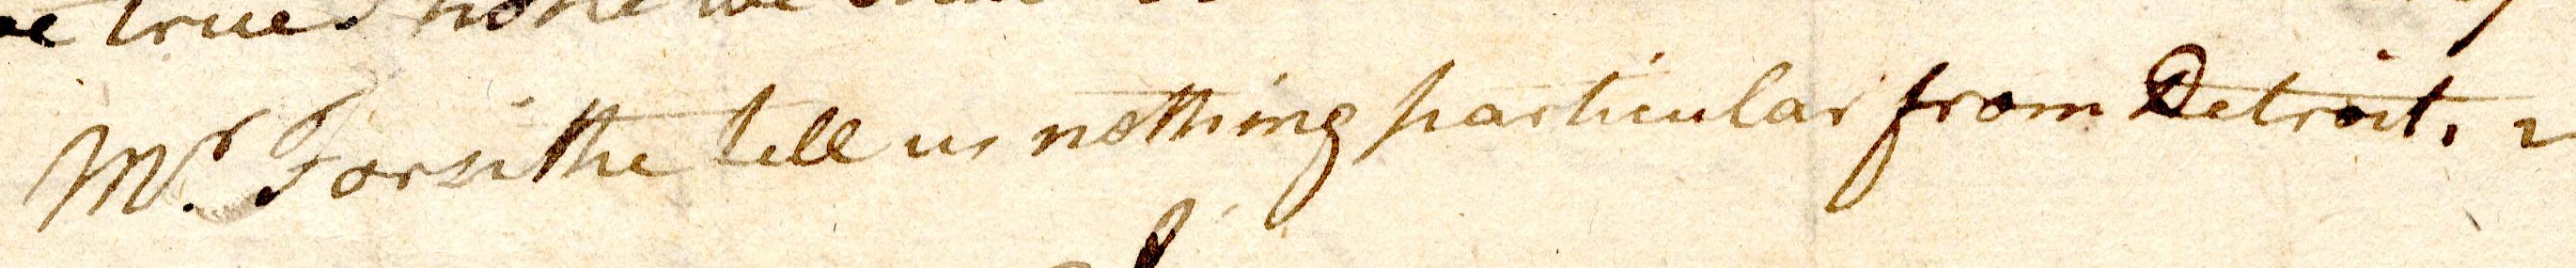M^r. Forsithe tell us nothing particular from Detroit.
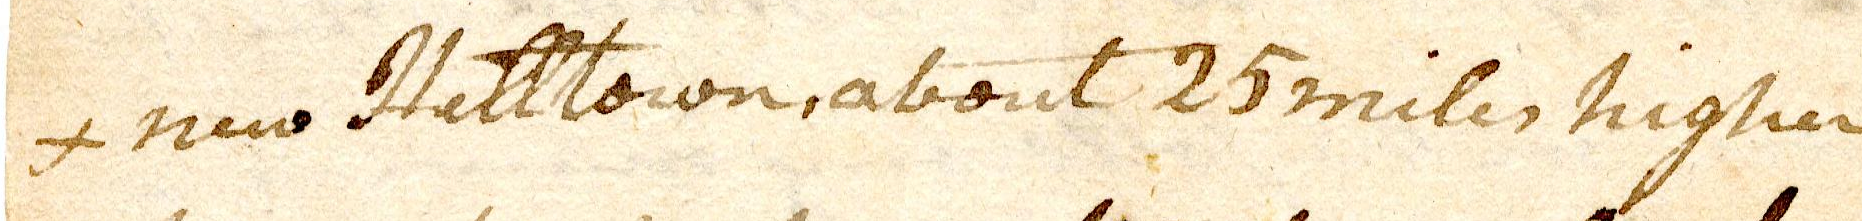& new Helltown, about 25 miles higher
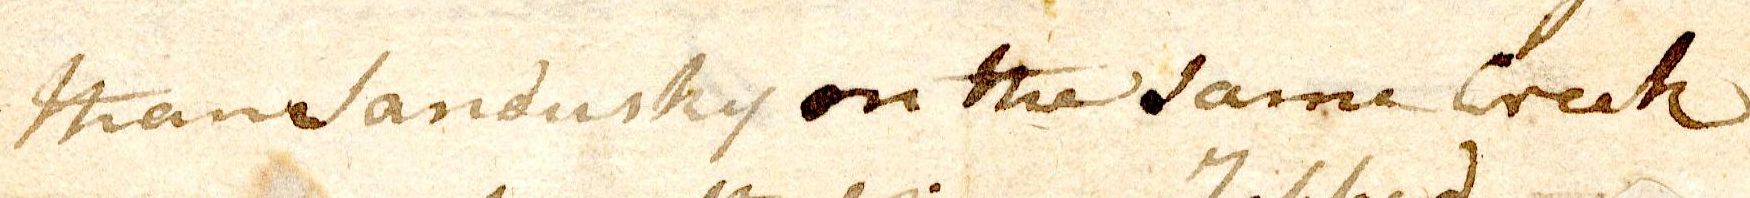than Sandusky on the same Creek
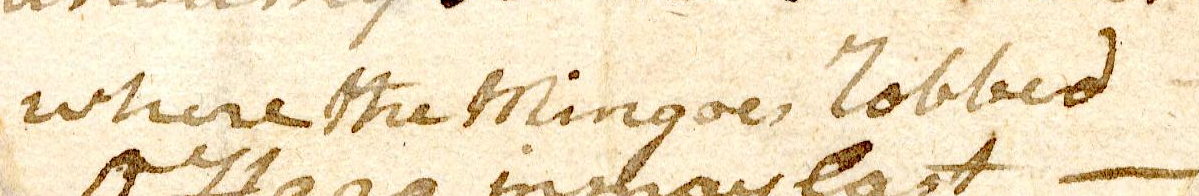where the Mingoes robbed
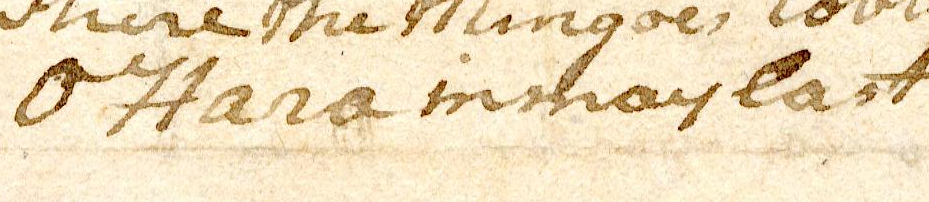O'Hara in may last
